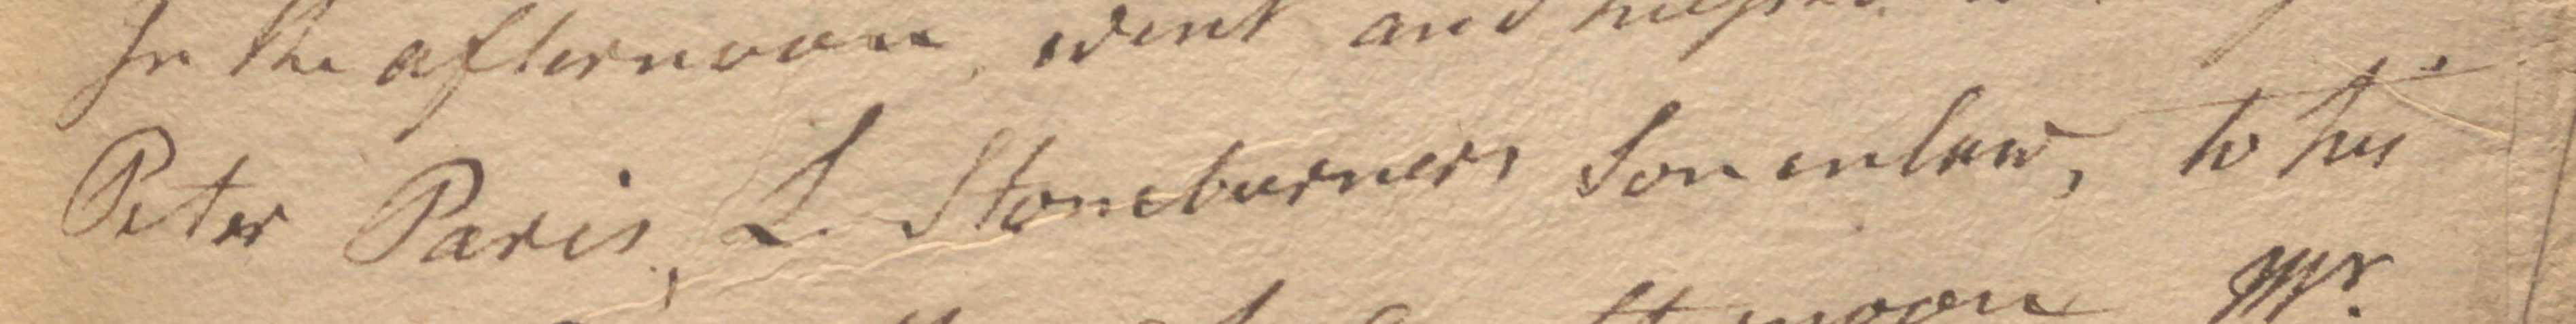Peter Paris L. Stoneburners Son in law, to his
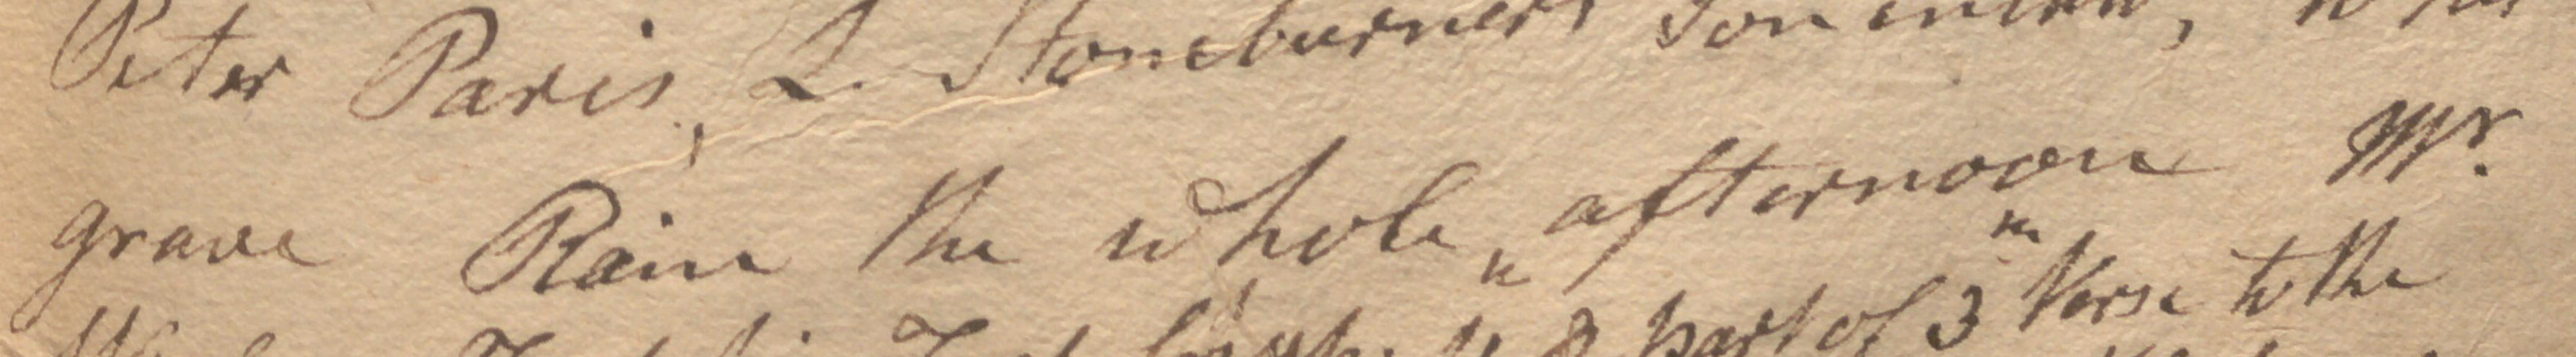grave Rain the whole, afternoon M^r.
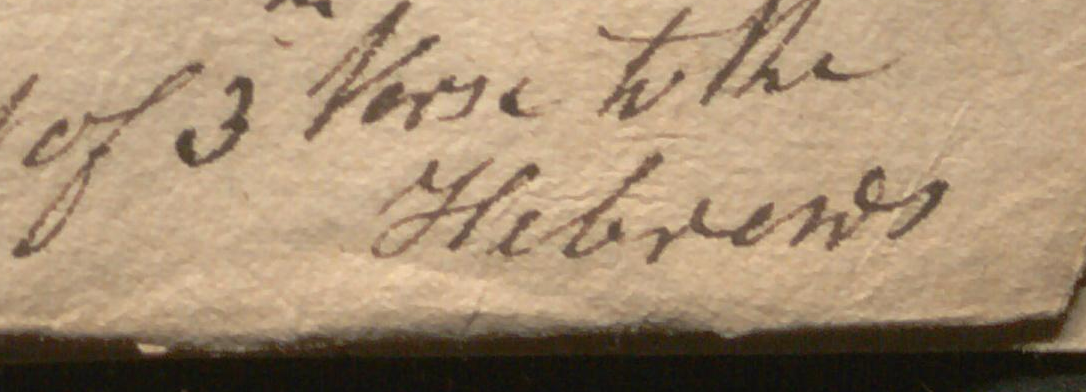Hebrews
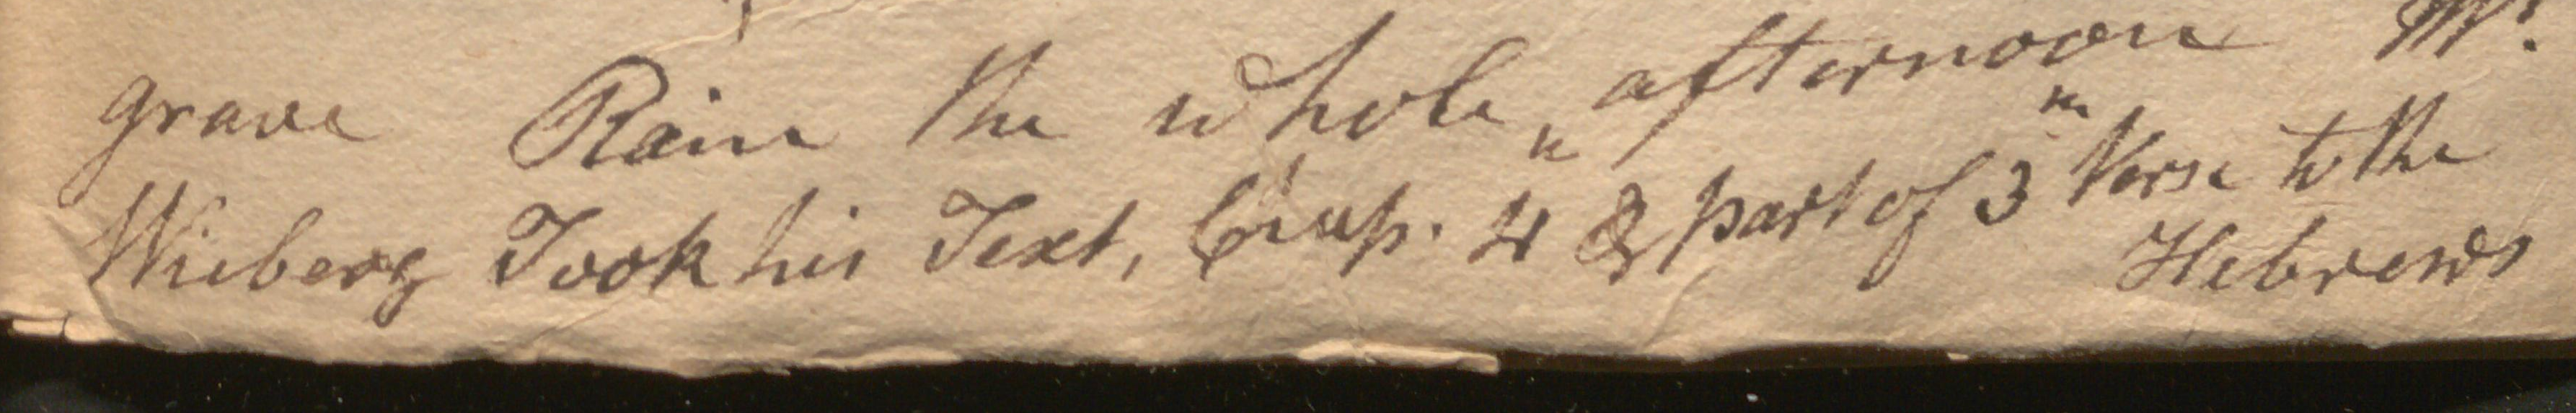Weiberg Took his Text, Chap 4^th & part of 3^rd. Verse to the
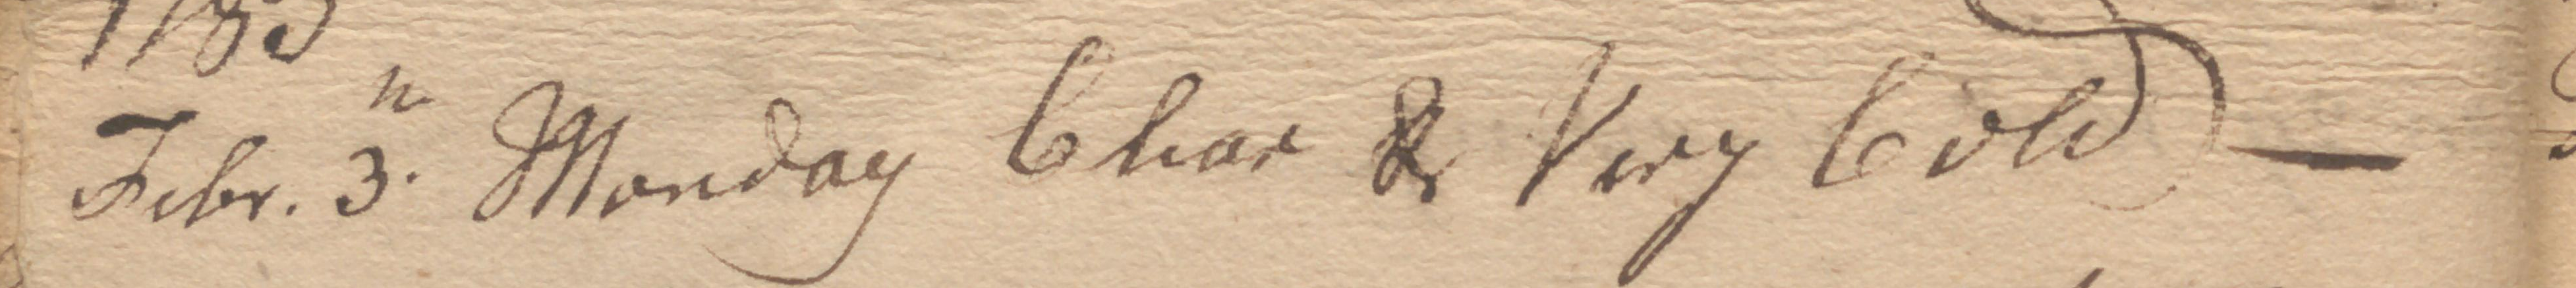Febr. 3^d. Monday Clear & Very Cold-
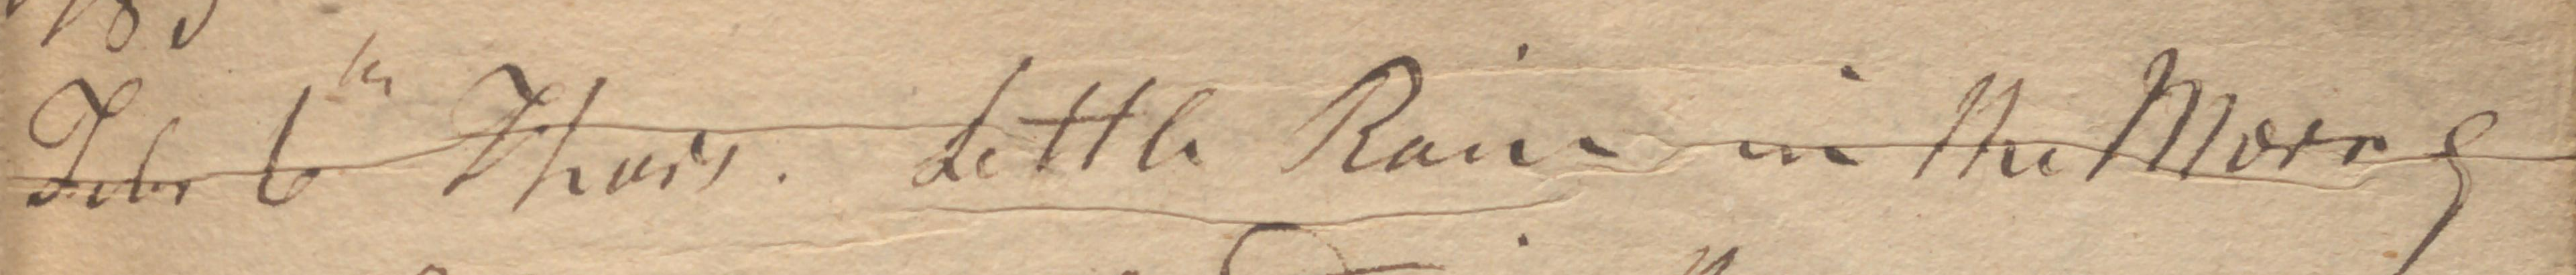Febr 6^th Thurs. Little Rain in the Morng
